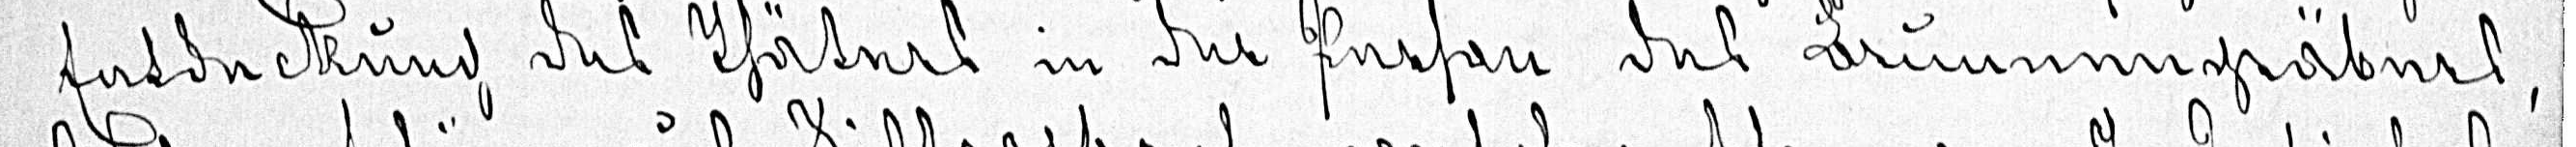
Entdeckung des Thäters in der Person des Brunnengräbers,
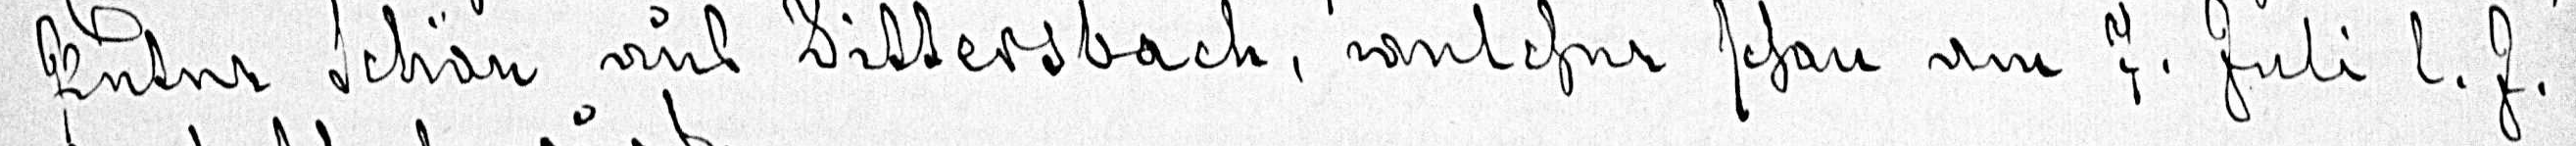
Peter Schön aus Dittersbach, welcher schon am 7. Juli l. J.
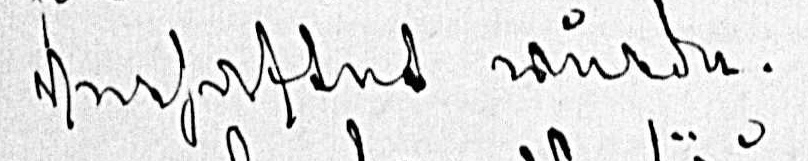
verhaftet wurde.
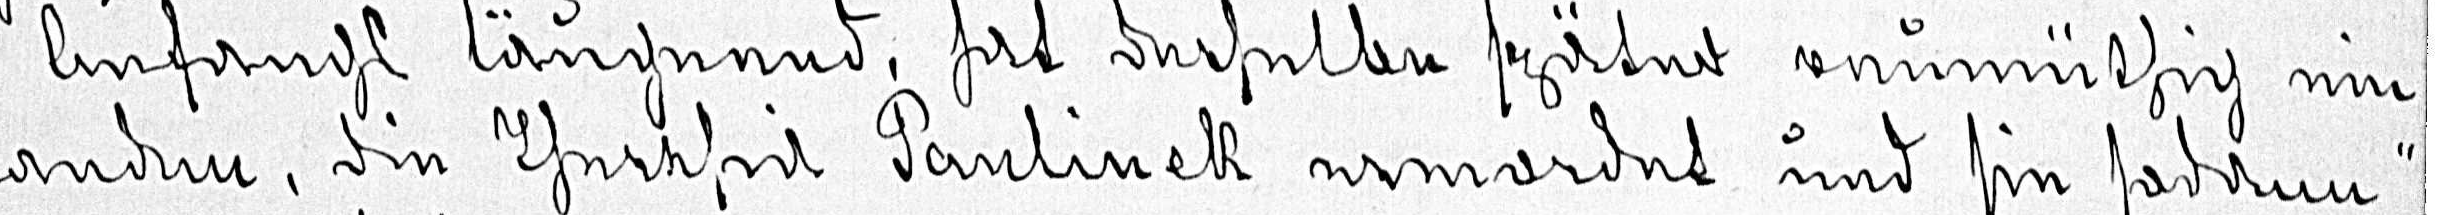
Anfangs läugnend, hat derselbe später reumüthig ein¬
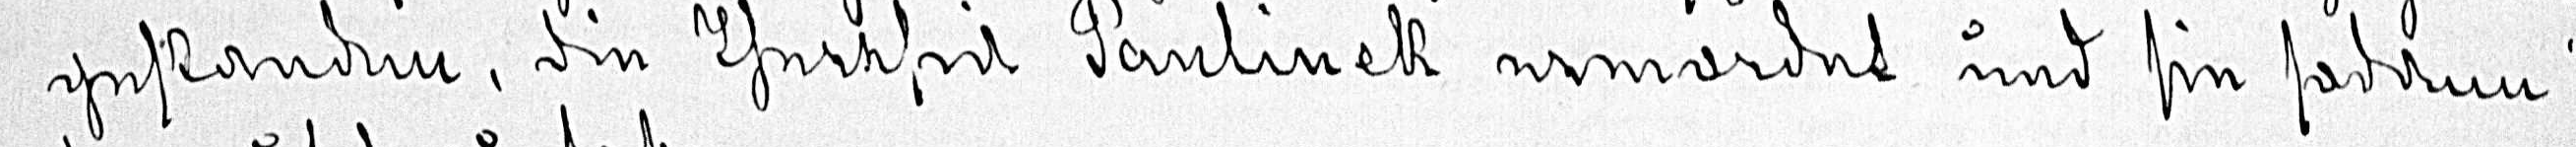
gestanden, die Theresia Paulinek ermordet und sie sodann
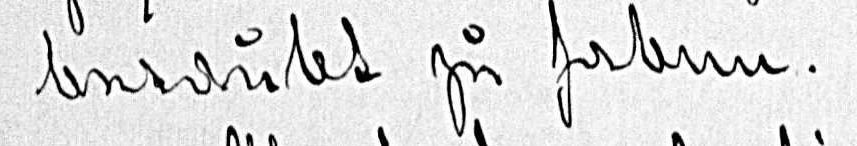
beraubt zu haben.
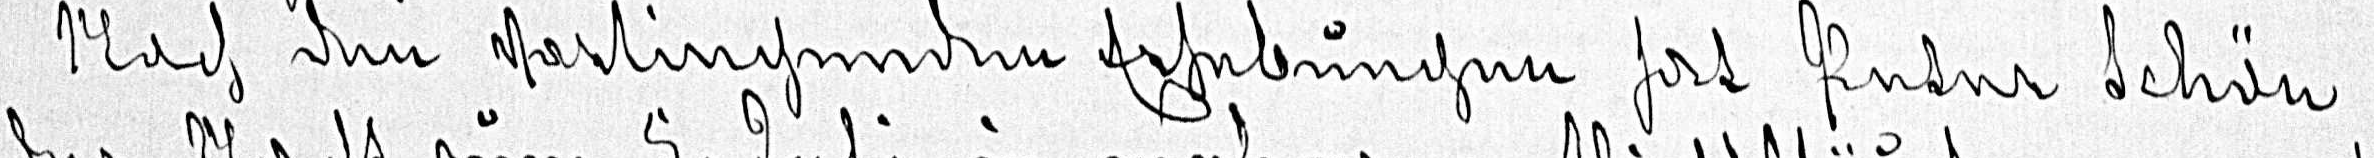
Nach den Vorliegenden Erhebungen hat Peter Schön
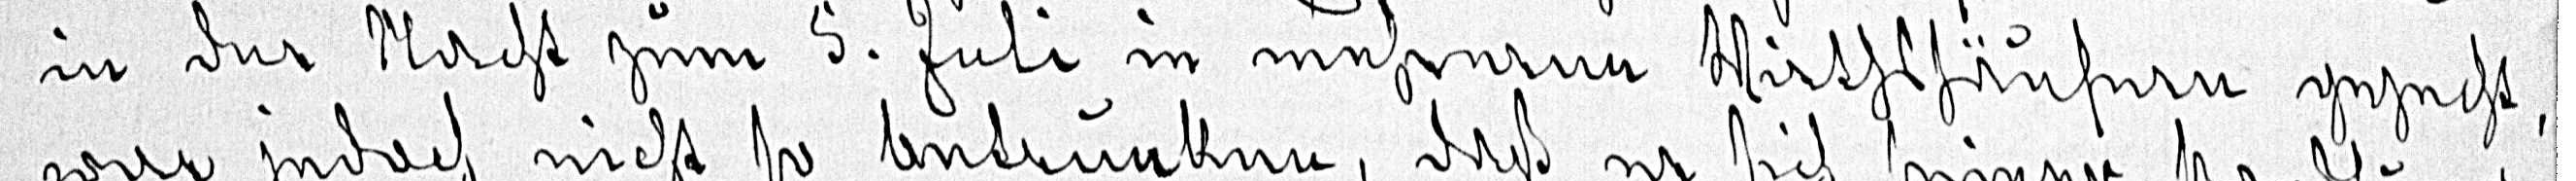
in der Nacht zum 5. Juli in mehreren Wirthshäusern gezecht
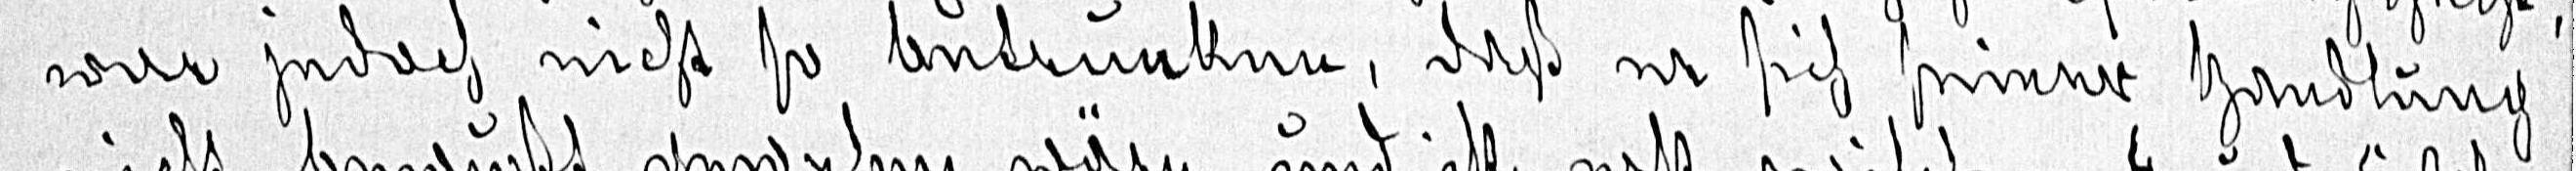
war jedoch nicht so betrunken, daß er sich seiner Handlung
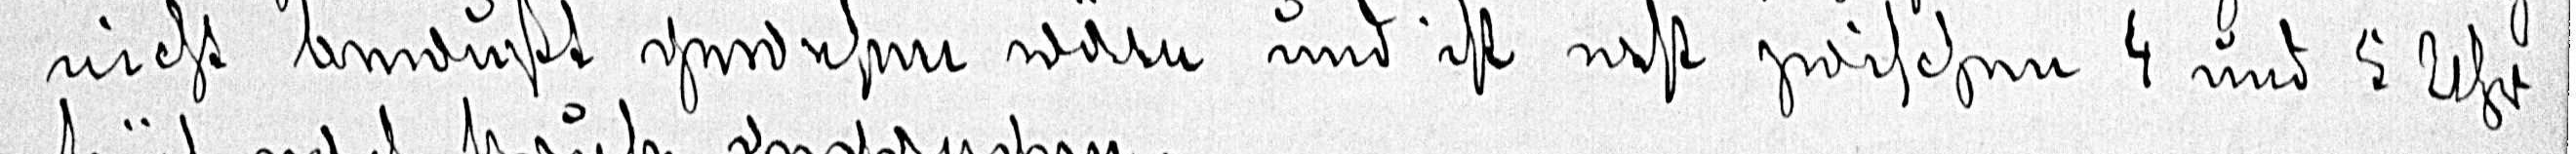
nicht bewußt gewesen wäre und ist erst zwischen 4 und 5 Uhr
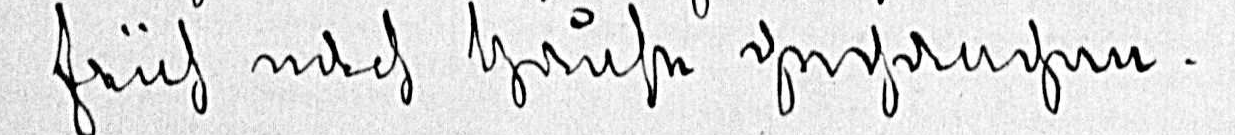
früh nach Hause gegangen.
